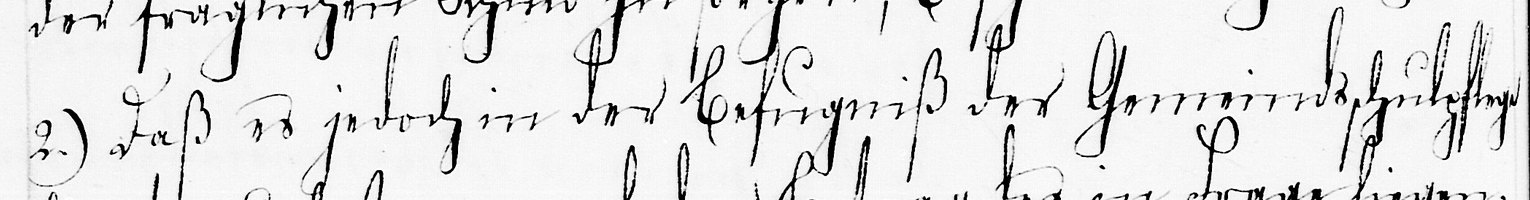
2.) Daß es jedoch in der Befugniß der Gemeindsschulpf¬
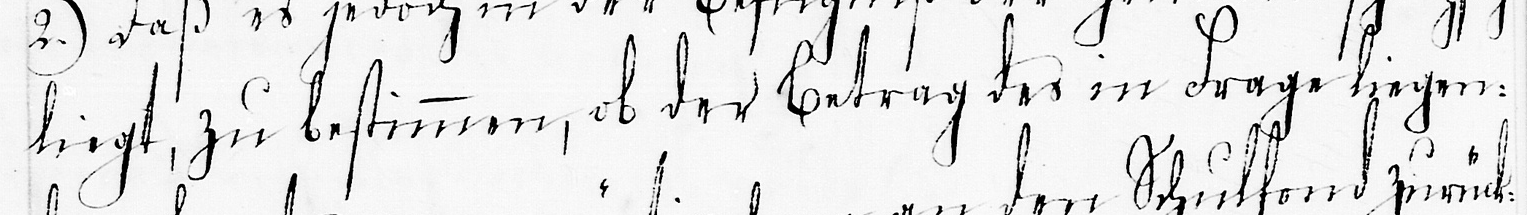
liegt, zu bestimmen, ob der Betrag des in Frage liegen¬
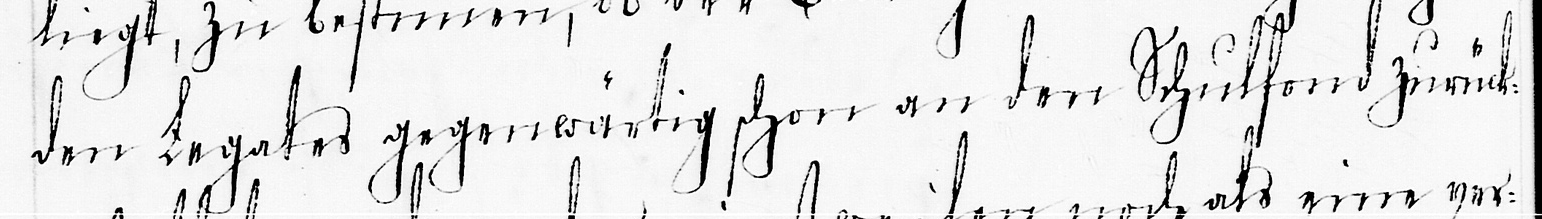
den Legates gegenwärtig schon an den Schulfond zurück¬
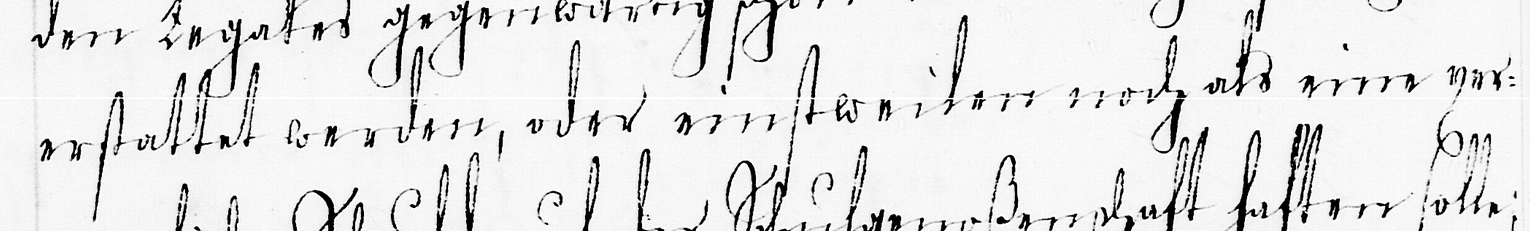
erstattet werden, oder einstweilen noch als eine ver¬
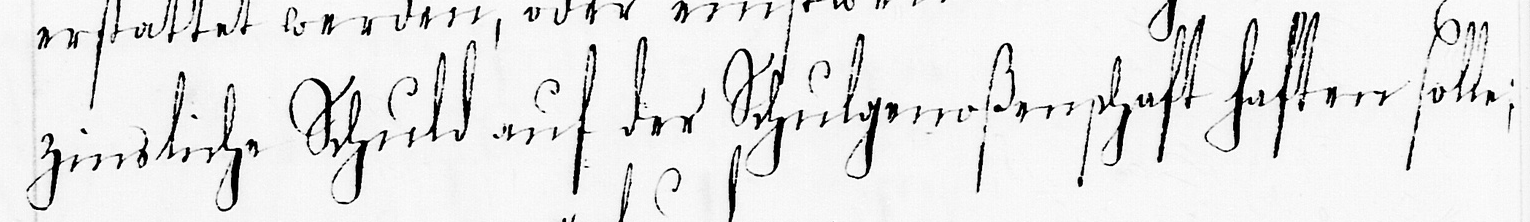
zinsliche Schuld auf der Schulgenoßenschaft haften sol¬
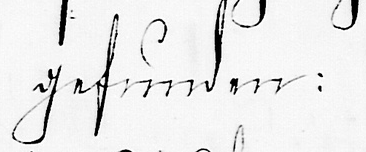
gefunden:
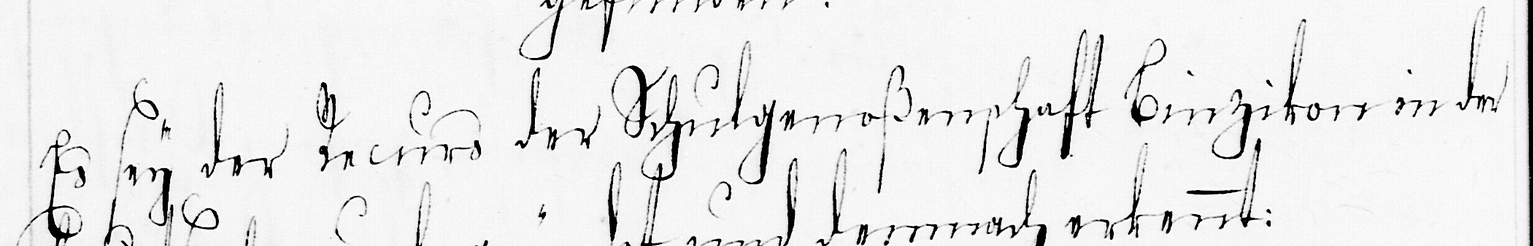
Es sey der Recurs der Schulgenoßenschaft Binzikon in der
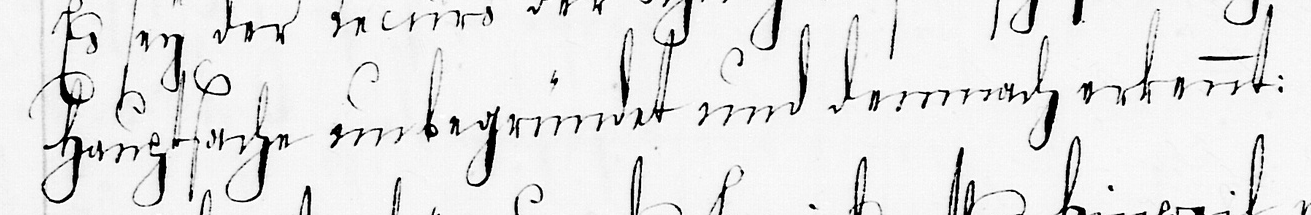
Hauptsache unbegründet und demnach erkennt:
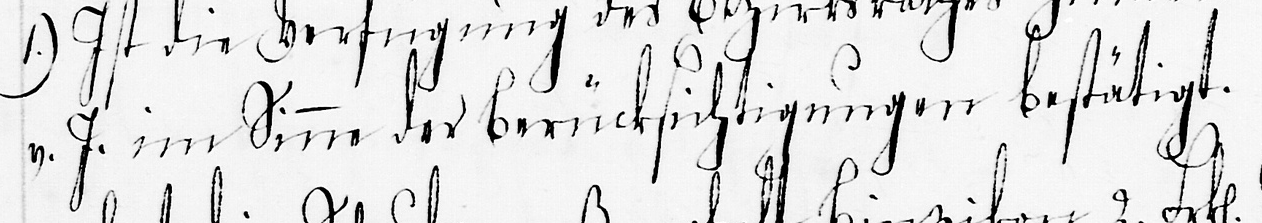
v. J. im Sinne der Berücksichtigungen bestätigt.
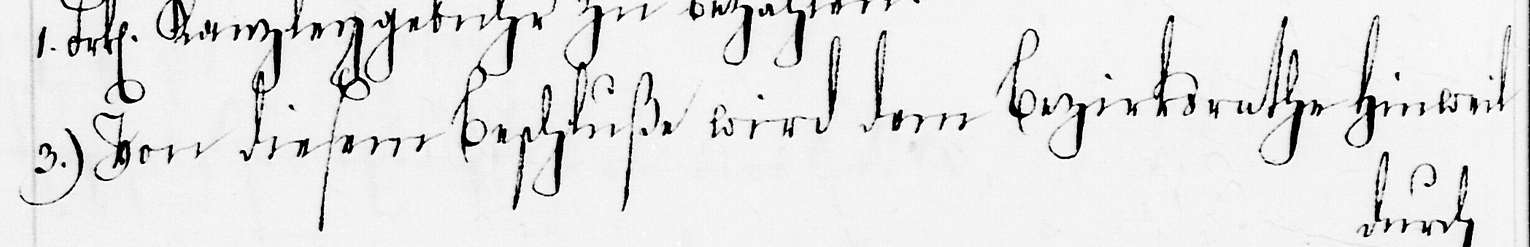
3.) Von diesem Beschluße wird dem Bezirksrathe Hinweil
